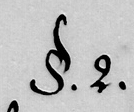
§. 2.
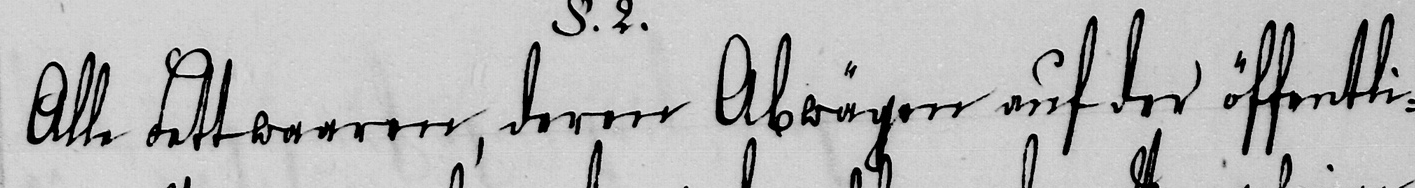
Alle Fettwaaren, deren Abwägen auf der öffentl¬
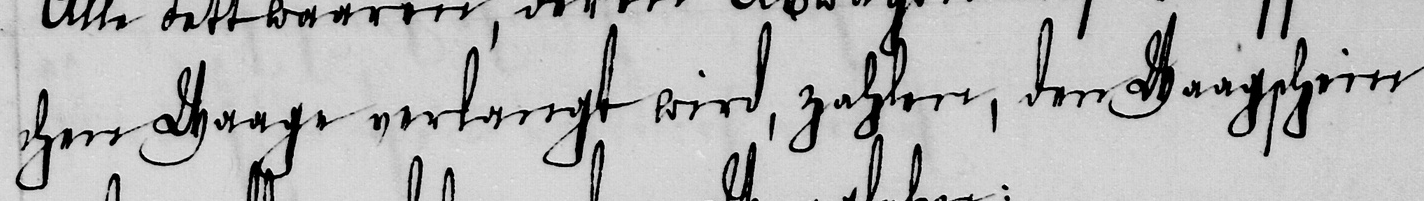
ichen Waage verlangt wird, zahlen, den Waagschein
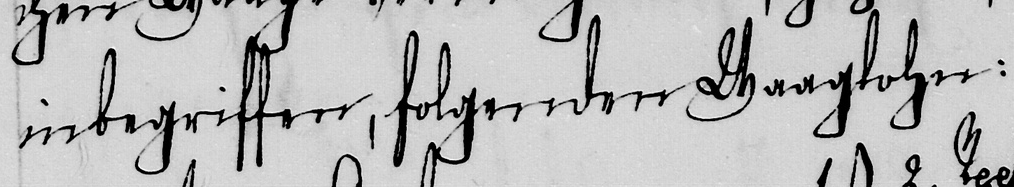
inbegriffen, folgenden Waaglohn:
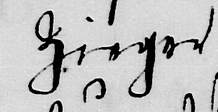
Zieger
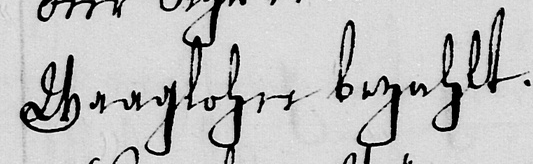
Waaglohn bezahlt.
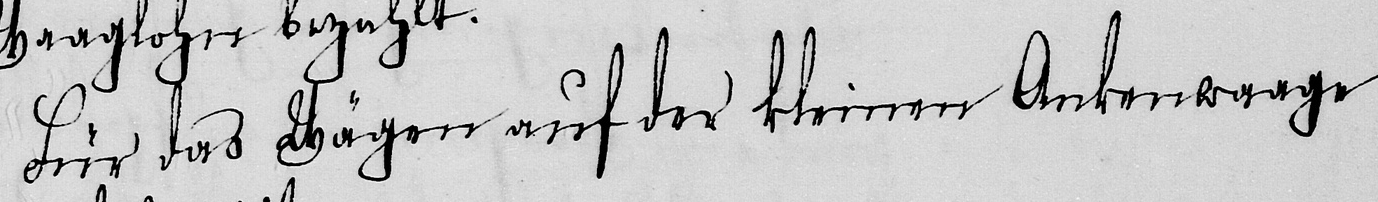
Für das Wägen auf der kleinen Ankenwaage
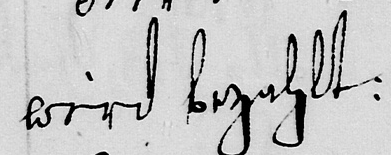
wird bezahlt:
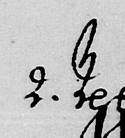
lb.
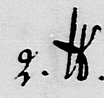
2. lb.
